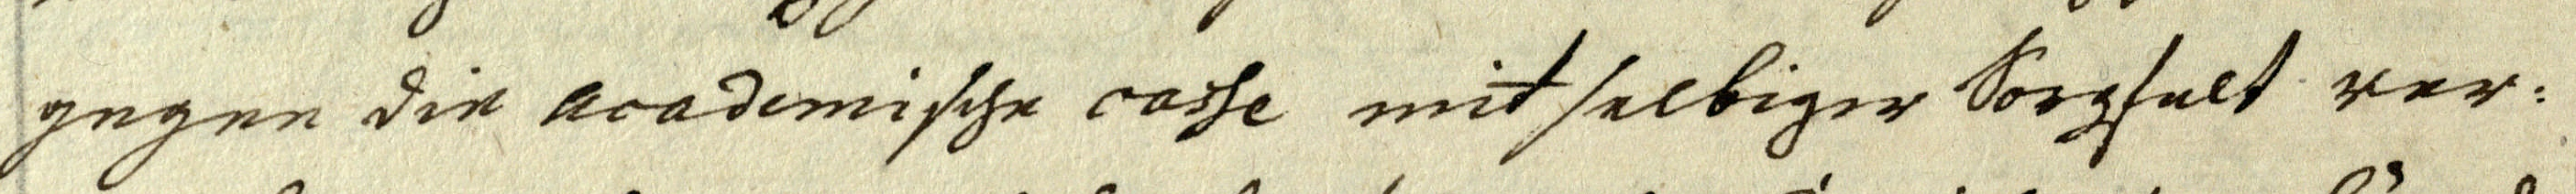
gegen die Academische casse mit selbiger Sorgfalt ver¬
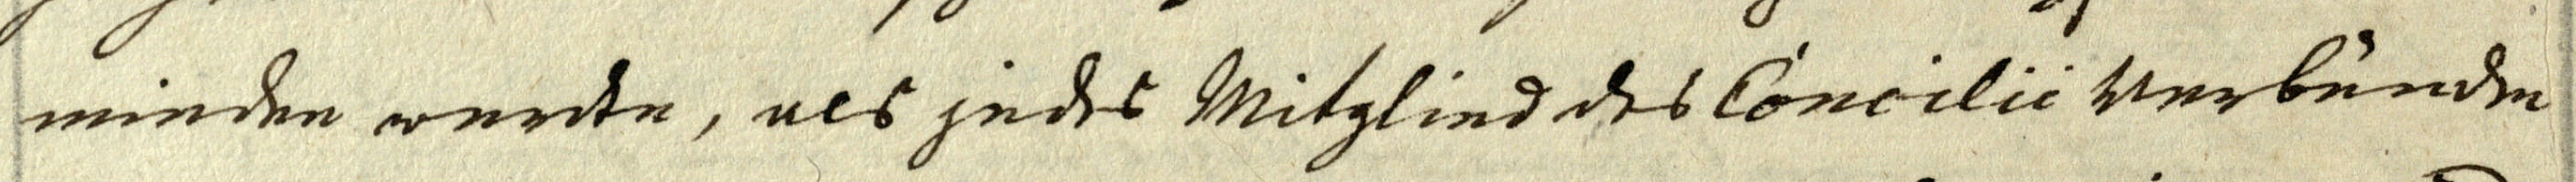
mieden werden, als jedes Mitglied des Concilii verbunden
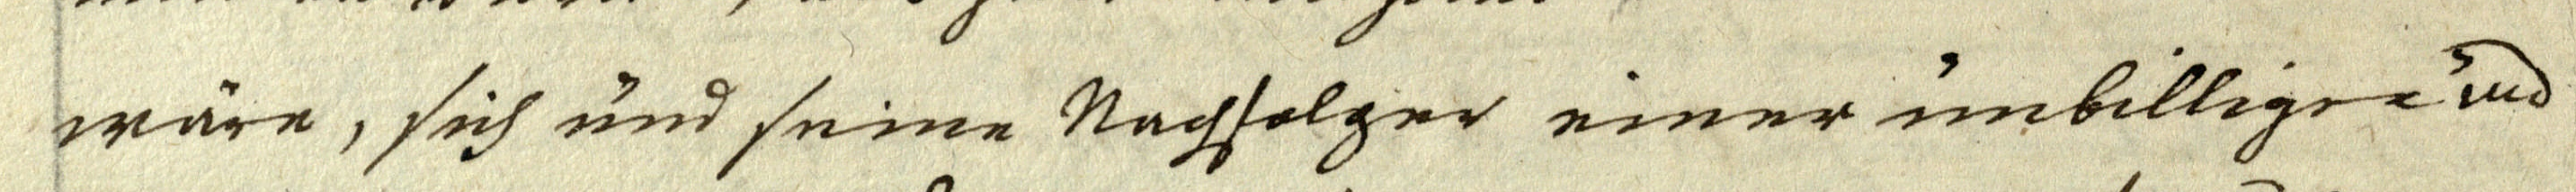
wäre, sich und seine Nachfolger einer unbilligen und
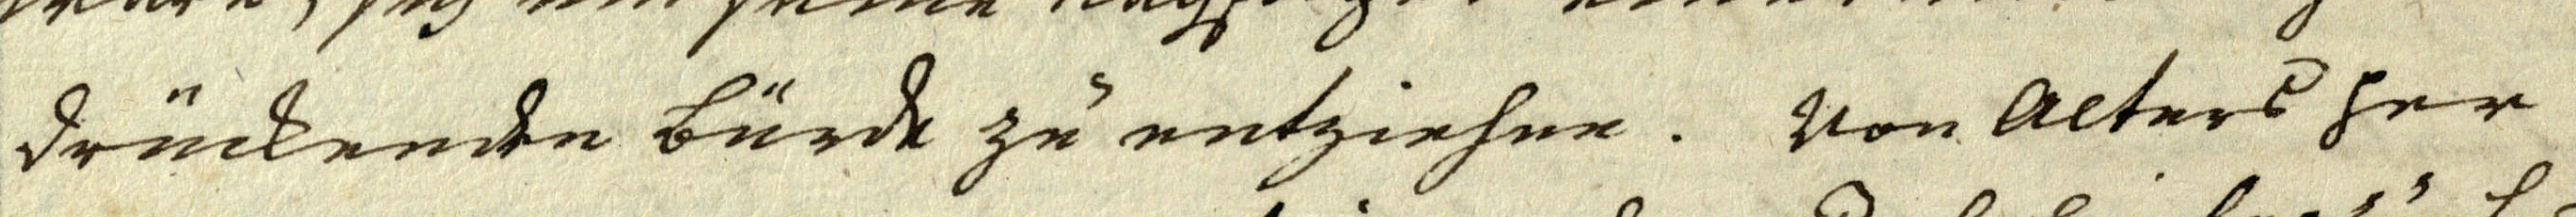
drückenden Bürde zu entziehen. Von Alters her
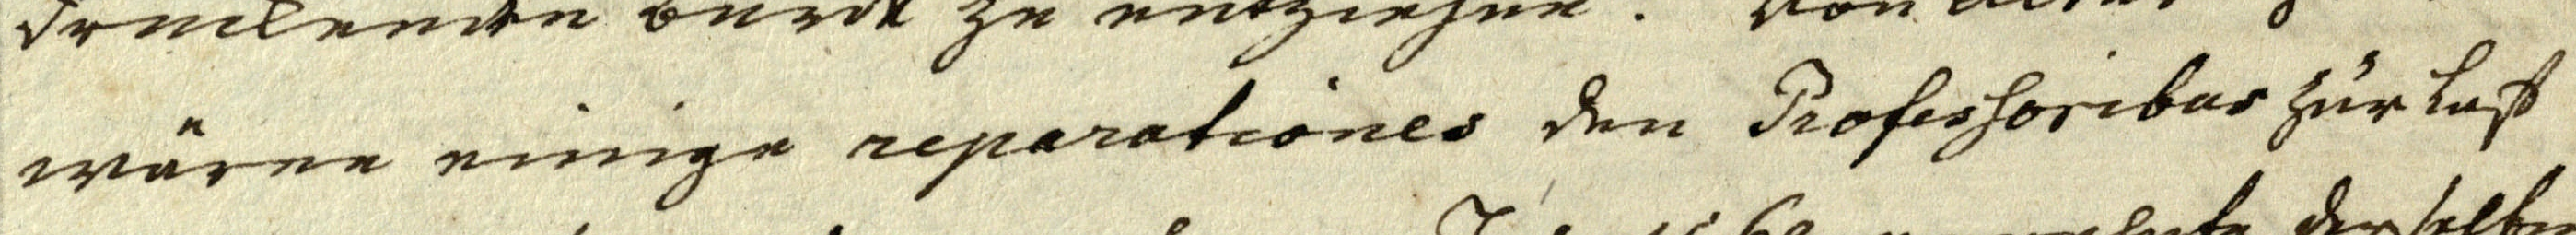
wären einige reparationes den Professoribus zur Last
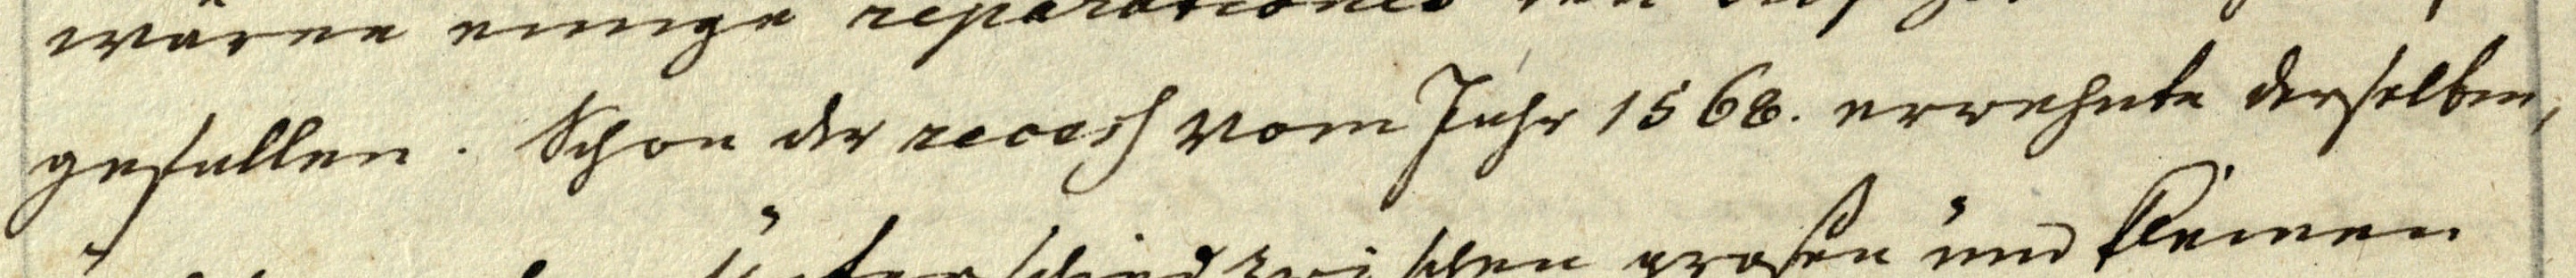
gefallen. Schon der recess vom Jahr 1568. erwehnte derselben,
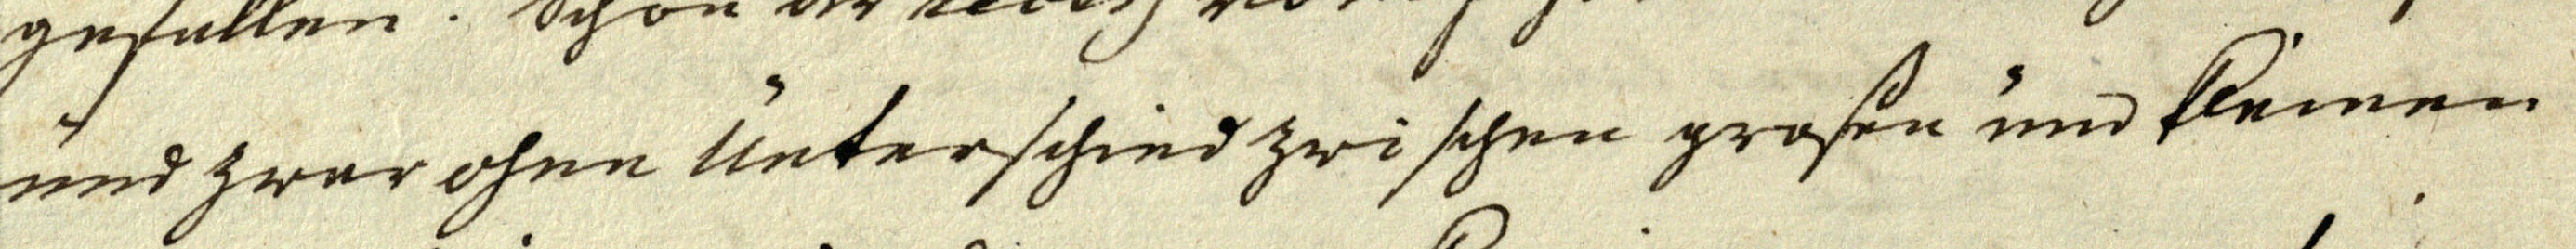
und zwar ohne Unterschied zwischen großen und kleinen
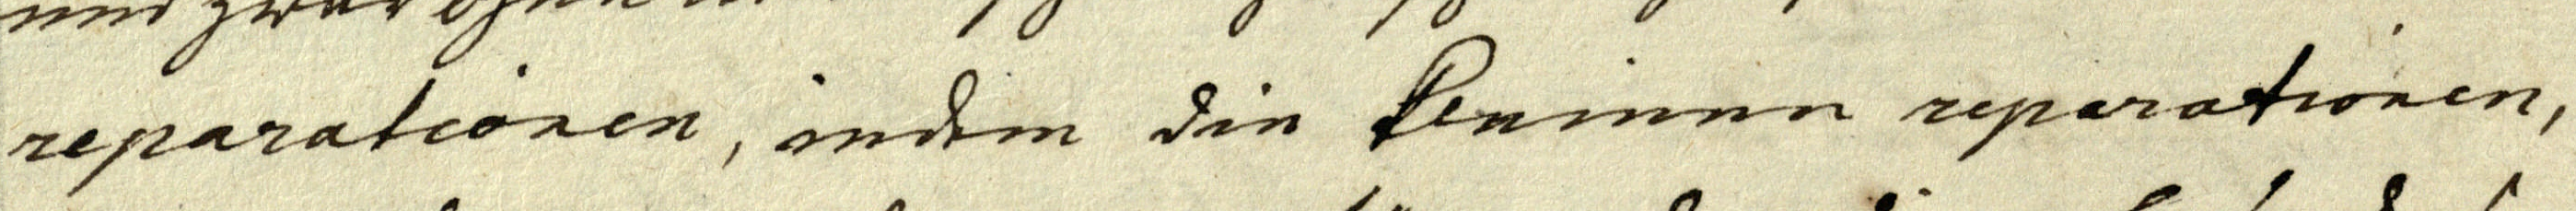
reparationen, indem die kleinen reparationen,
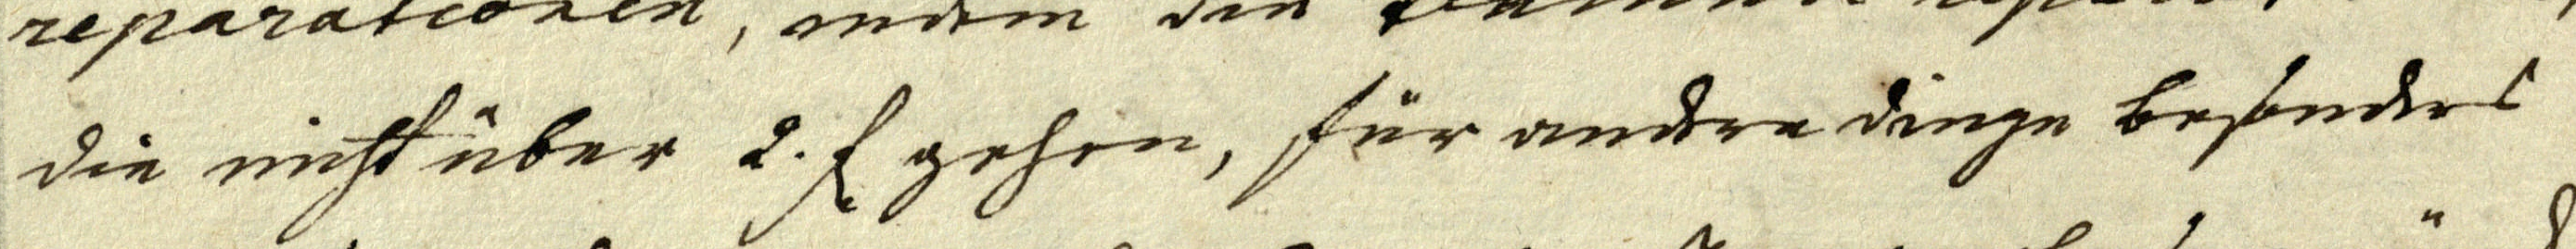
die nicht über 2 s. gehen, für andere Dinge besonders
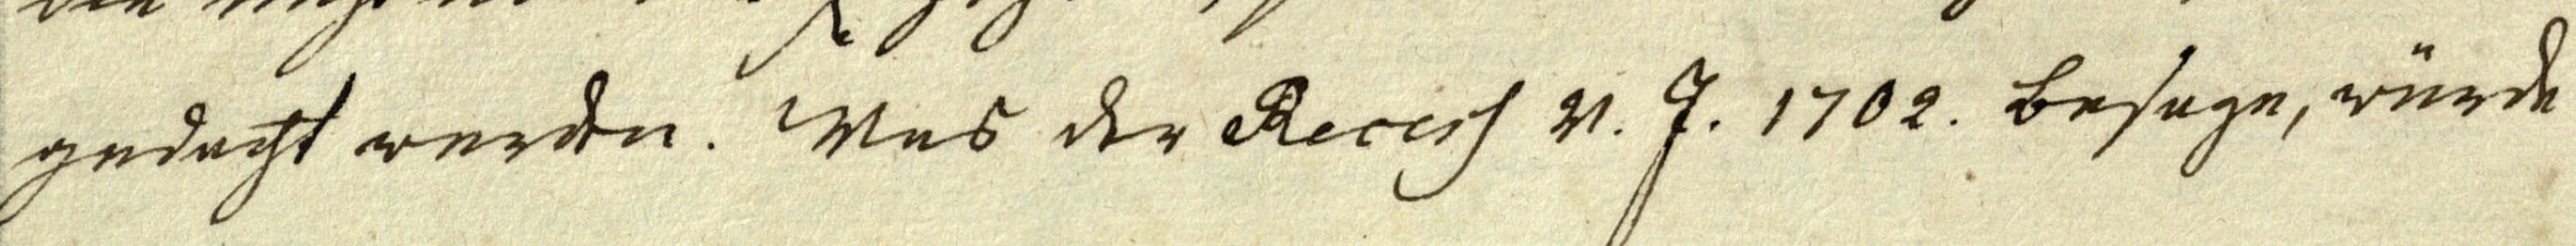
gedacht werden. Was der Recess v. J. 1702. besage, würde
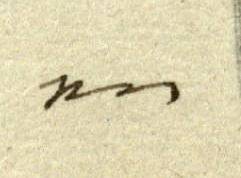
er
